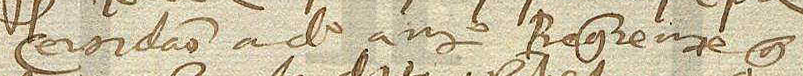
Certidaõ a do anto Req̄rente q̄
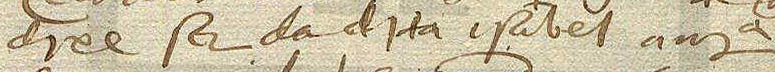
djxe ser da djta isabel anta e
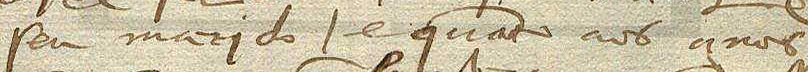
seu marjdo / e quāto aos anos
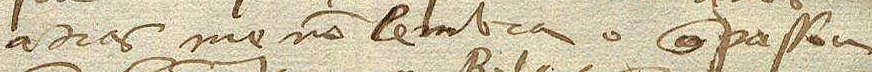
atras me nō lembra o q̄ passou
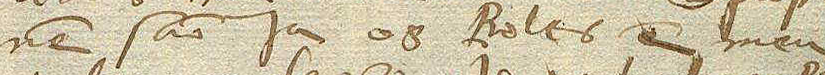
nē são Ja os Roles ē meu
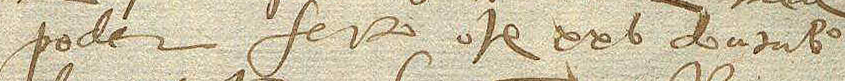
poder feito oJe xxv doutubo
